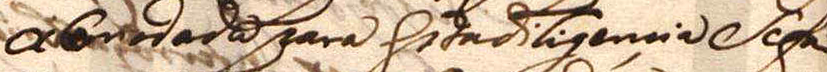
acomodada para esta diligençia se fa
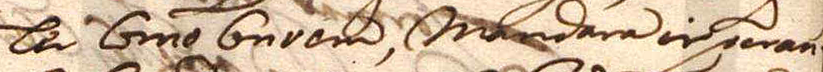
zer como convem, mandara ir peran
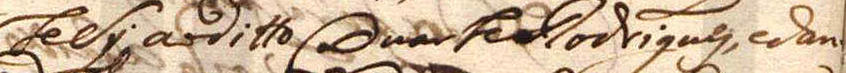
te sy ao ditto Duarte Rodrigues, e dan
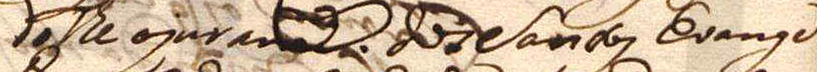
dolhe o juram.to dos Santos Evange
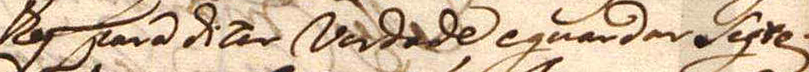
lhos para dizer verdade e guardar segre
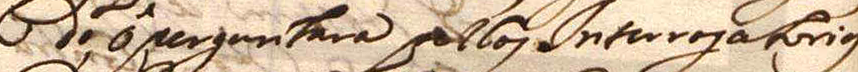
do, ô perguntara pellos Interrogatorios
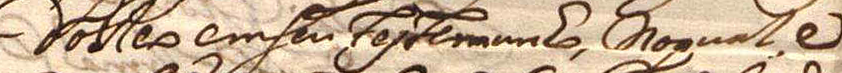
do Reo em seu testemunho, no qual, e
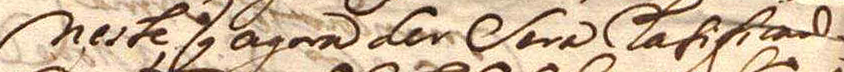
neste q̄ agora der sera Ratificado
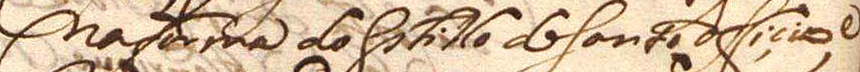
na forma do estillo do santo offiçio, e
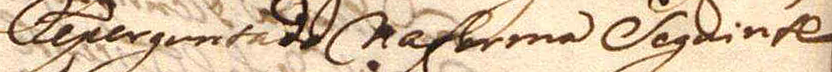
Reperguntado na forma seguinte
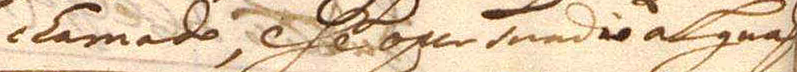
chamado, e se o persuadio alguā
